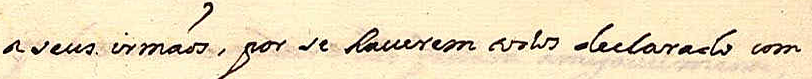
a seus irmaõs, por se hauerem todos declarado com
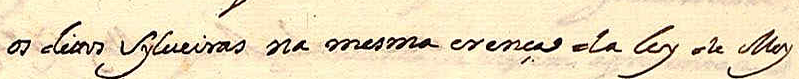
os dittos Sylueiras na mesma crença da ley de Moy
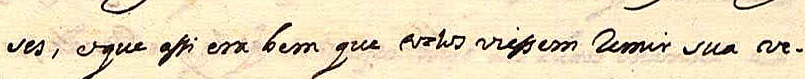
ses, e que assi era bem que todos viessem Remir sua ve
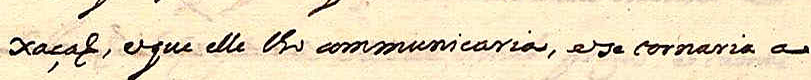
xaçaõ, e o que elle lho communicaria, e se tornaria a
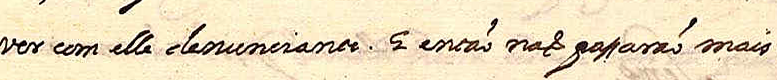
ver com elle denunciante. E entaõ naõ passaraõ mais.
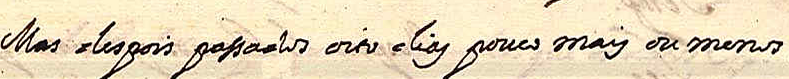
Mas despois passados oito dias pouco mais ou menos,
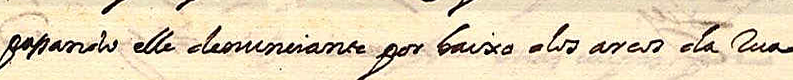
passando elle denunciante por baixo dos arcos da Rua
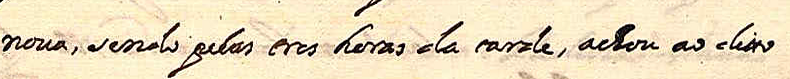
noua, sendo pelas tres horas da tarde, achou ao ditto
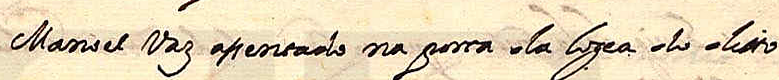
Manoel Vaz assentado na porta da logea do ditto
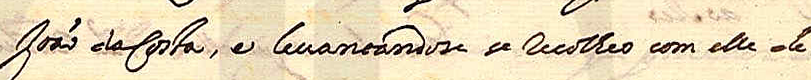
Joaõ da Costa, e leuantandose se Recolheo com elle de
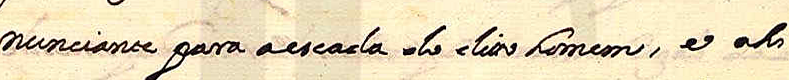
nunciante para a escada do ditto homem, e ahi
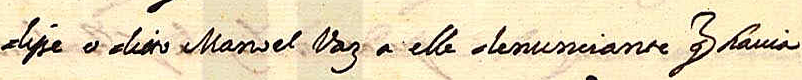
disse o ditto Manoel Vaz a elle denunciante q̄ hauia
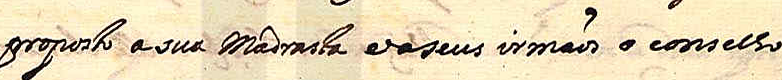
proposto a sua madrasta e a seus irmaõs o conselho
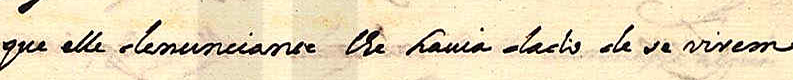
que elle denunciante lhe hauia dado de se virem
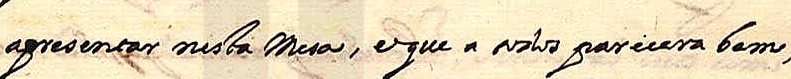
apresentar nesta mesa, e que a todos parecera bem,
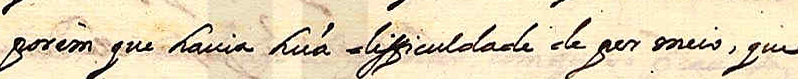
porem que hauia huā difficuldade de permeio, que
